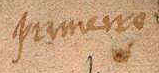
primeiro
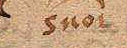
snōr
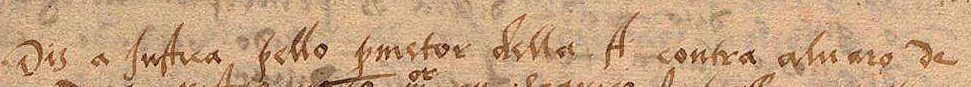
Dis a Justica pello ꝓmetor della A contra aluaro de
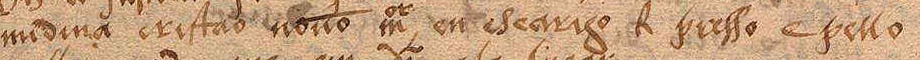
medina cristão nouo mor en escarigo R presso e pello
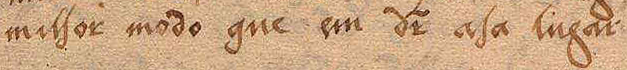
milhor modo que em drto aJa lugar
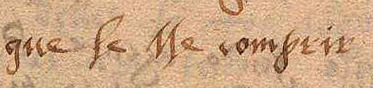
que se lhe comprir
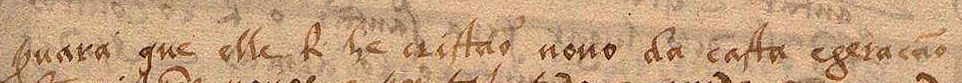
ꝓuara que elle R he cristaõ nouo da casta e geracão
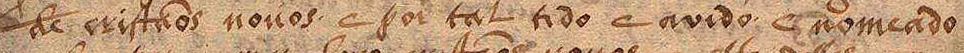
de cristãos nouos. e por tal tido e avido e nomeado
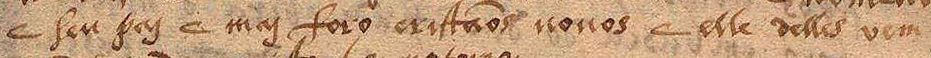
e seu pay e maj foro cristãos nouos E elle delles vem
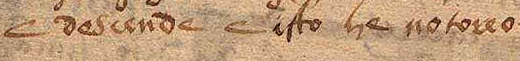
e descende e isto he notoreo.
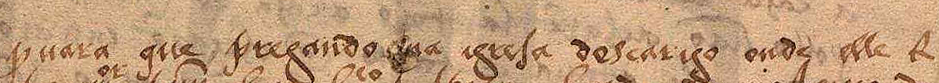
ꝓuara que pregando na igreJa descarigo onde elle R
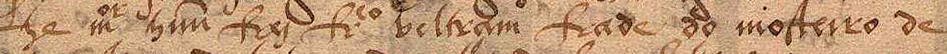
he mor huū frej frco beltram frade do mosteiro de
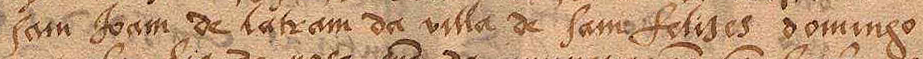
sam Joam de latram da villa de sam felizes domingo
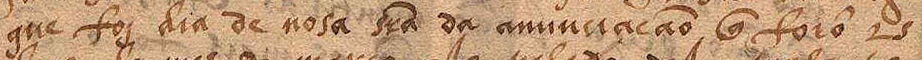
que foj dia de nosa sr̄a da anunciacão q̄ forō 25
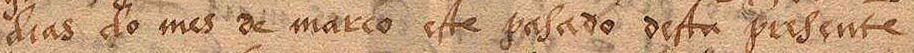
dias do mes de marco este pasado desta presente
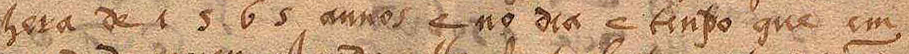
hera de 1565 annos e no dia e tenpo que em
